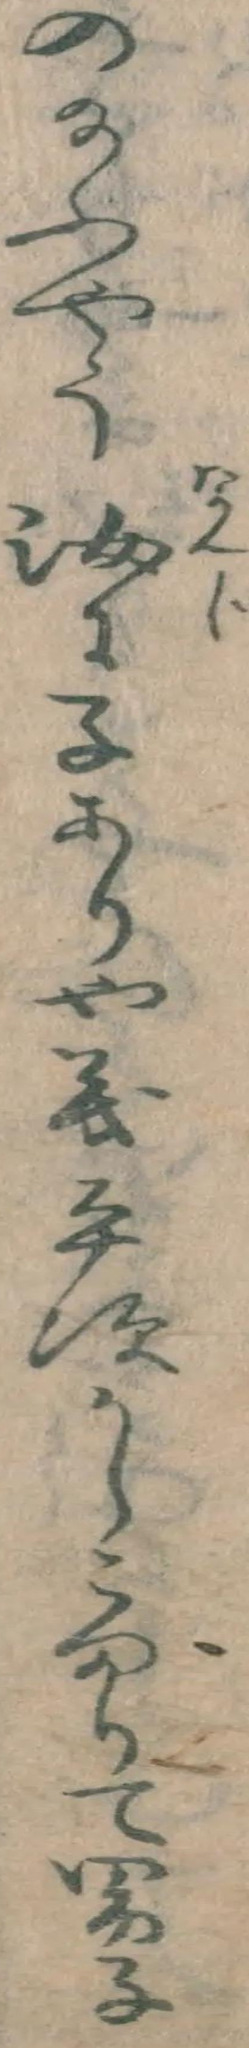の給ふやう汝に子のありや義平次かしこまりて男子

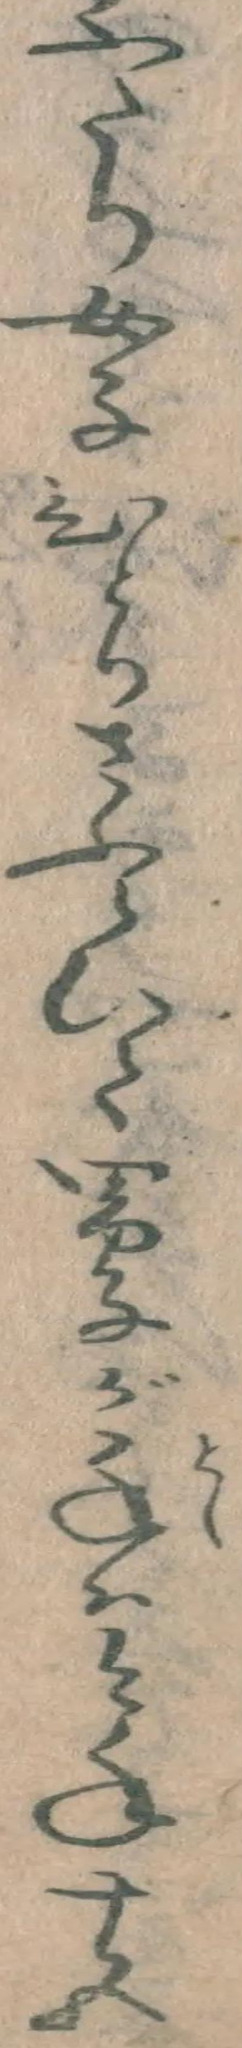ふたり女子ひとりさふらひて男子が年は今年十五
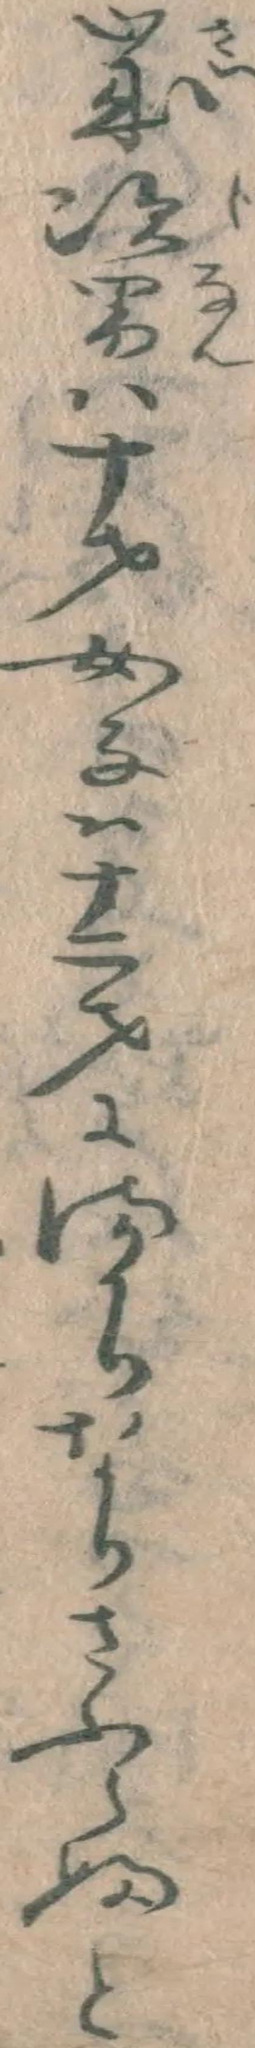歳次男は十才女子は十二才にまかりなりさふらふと
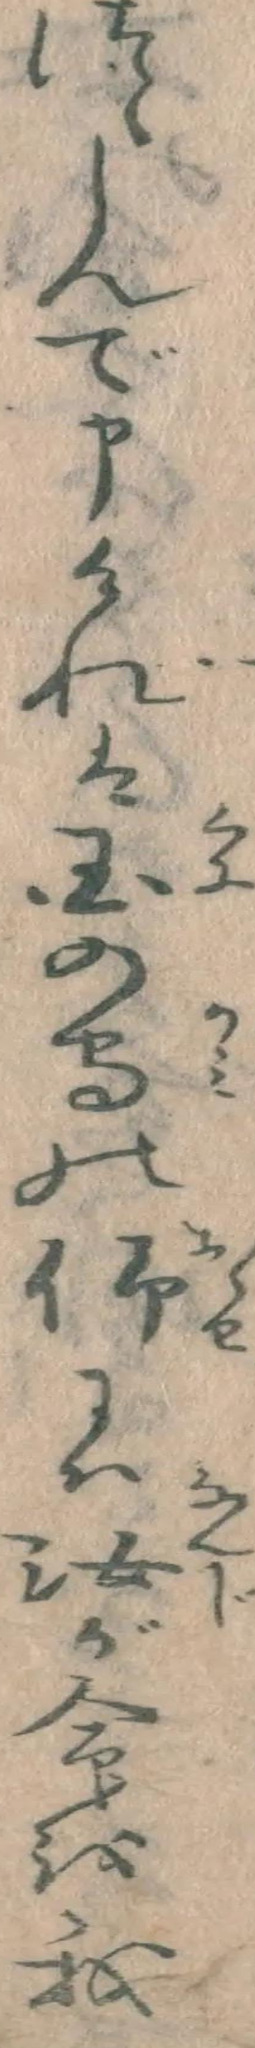つゝしんで申けれは国の守の仰には汝が命を我
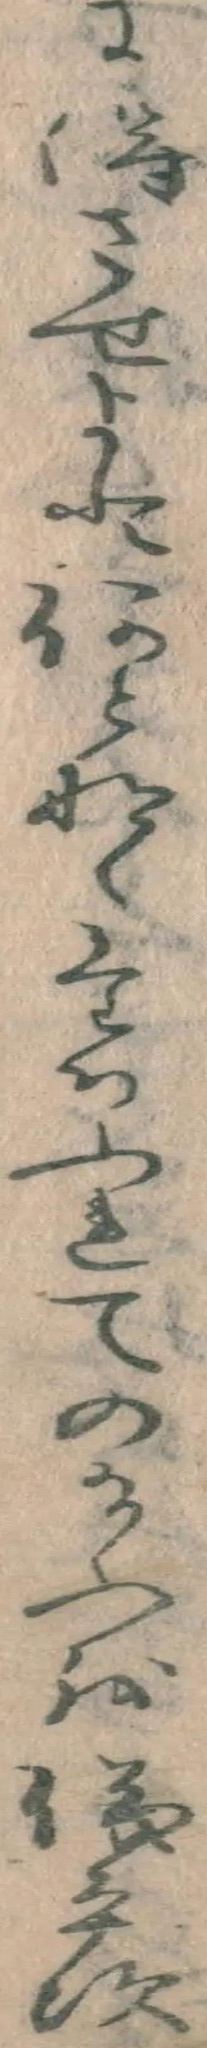に得させよと何となくたはふれての給ふを儀平次
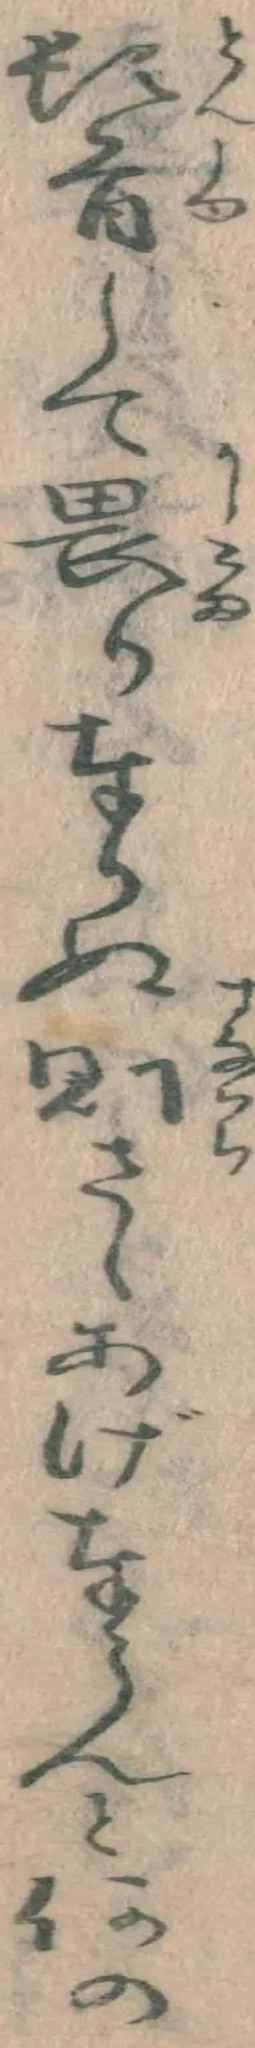頓首して畏り奉りぬ則さしあげ奉らんと何の
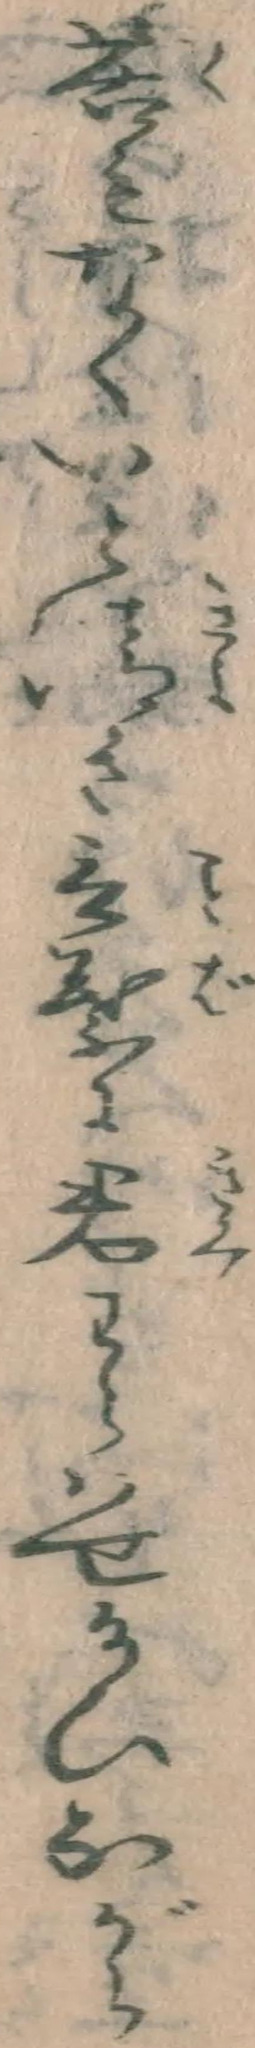苦もなくいと清き言葉に君わらはせ給ひながら
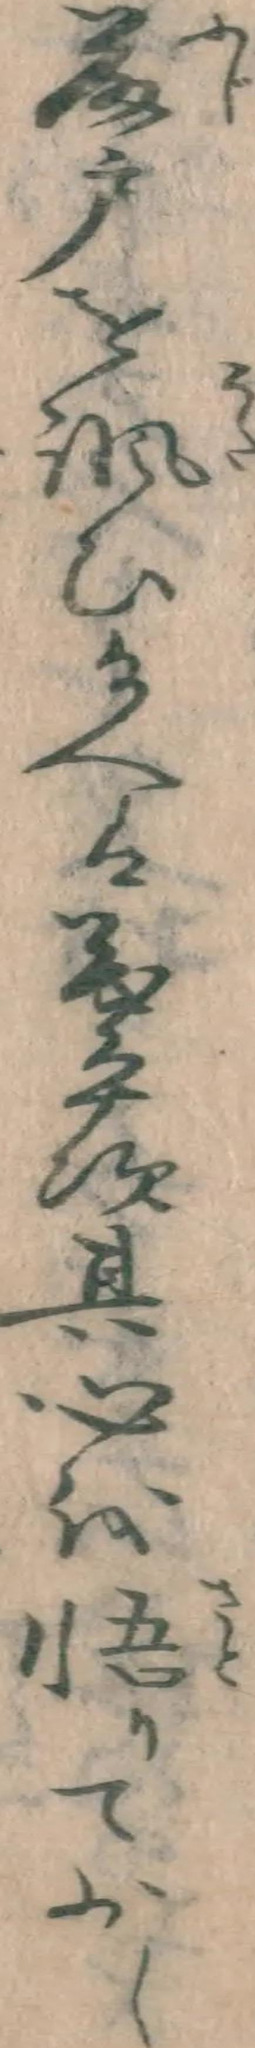藤戸を諷ひ給へは義平次其心を悟りて少し
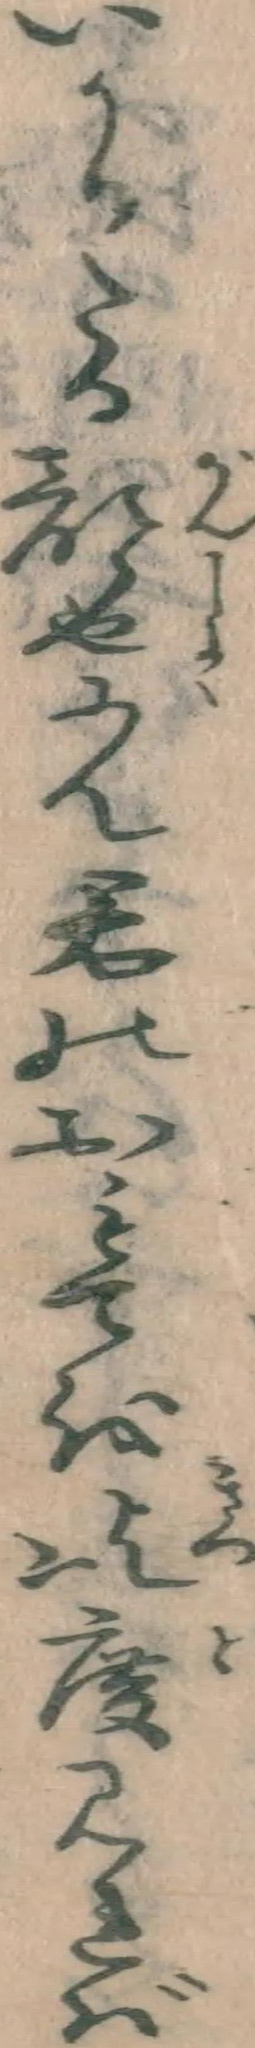いかりたる顔色にて君のおもてを屹度見れば
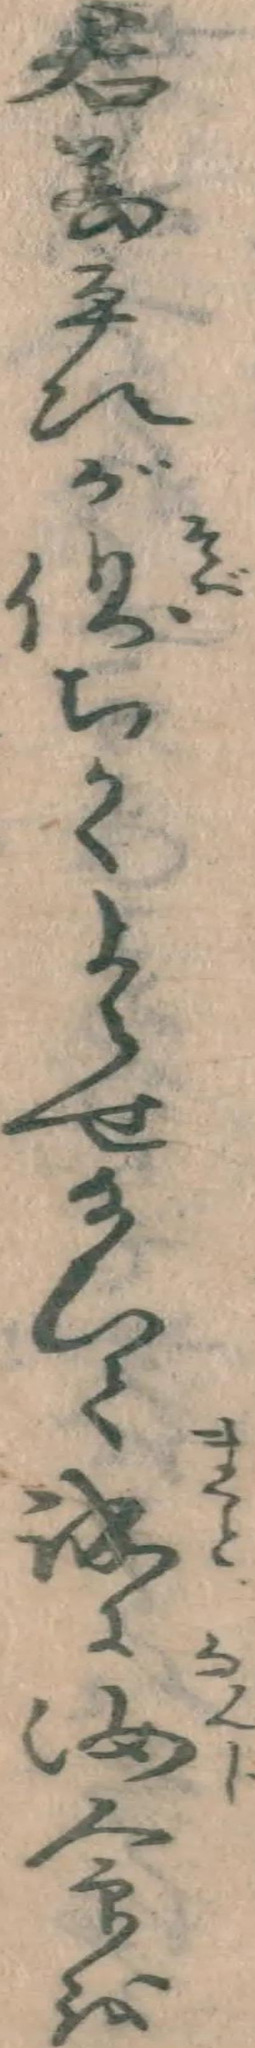君義平次が側ちかくよらせ給ひて誠に汝命を
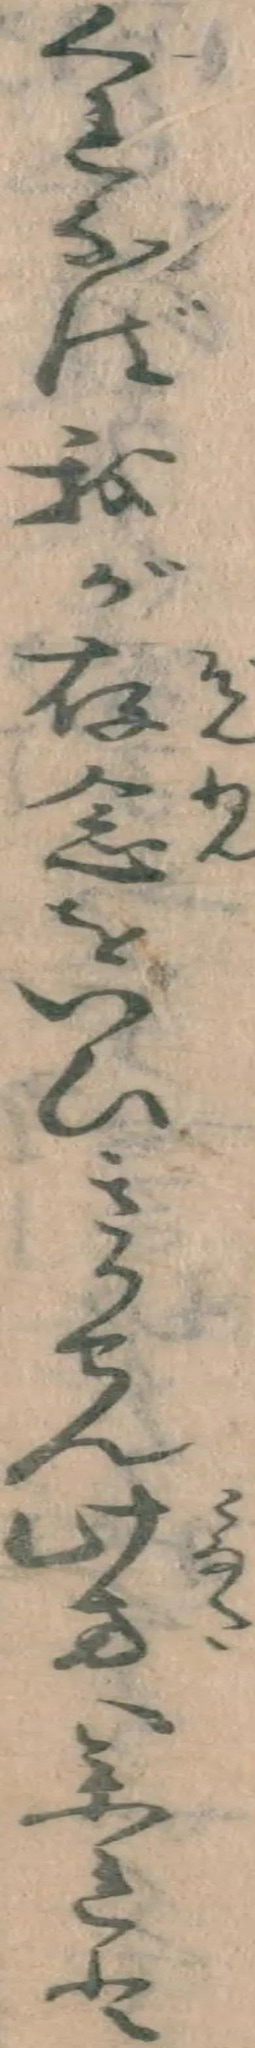くれなば我が存念をいひきかせん此方へ参れと
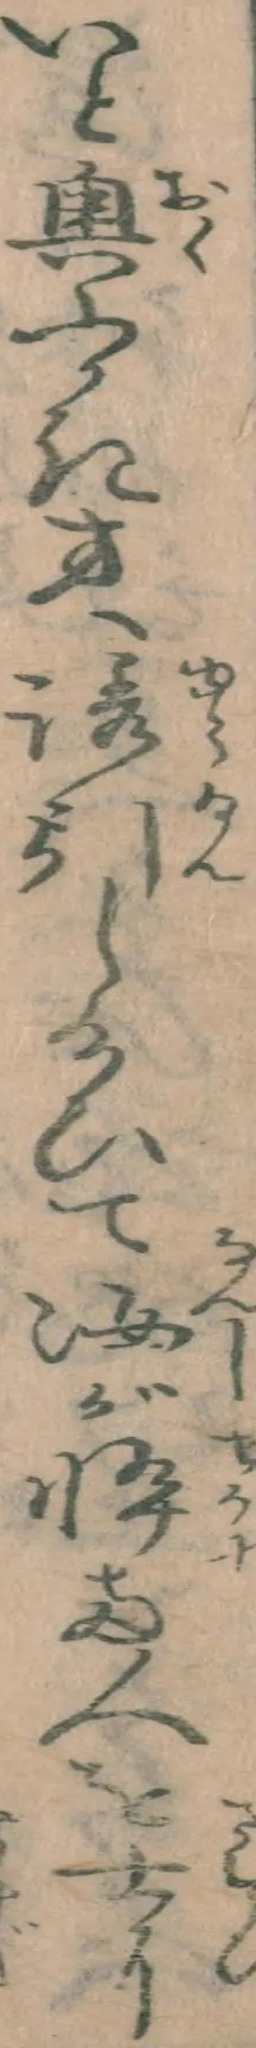いと奥ふかき方へ誘引し給ひて汝が倅両人を士に
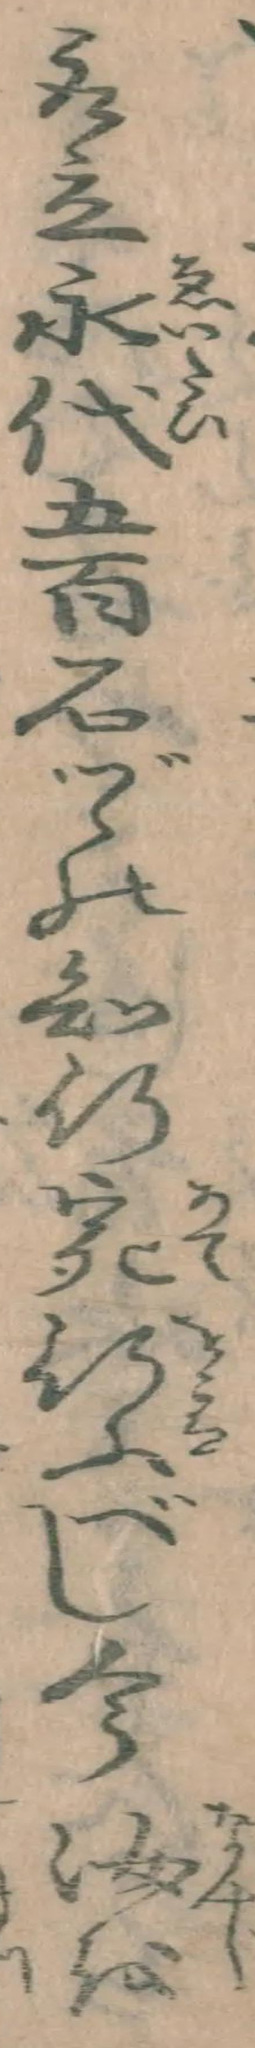取立永代五百石づゝの知行宛行ふべし今汝を
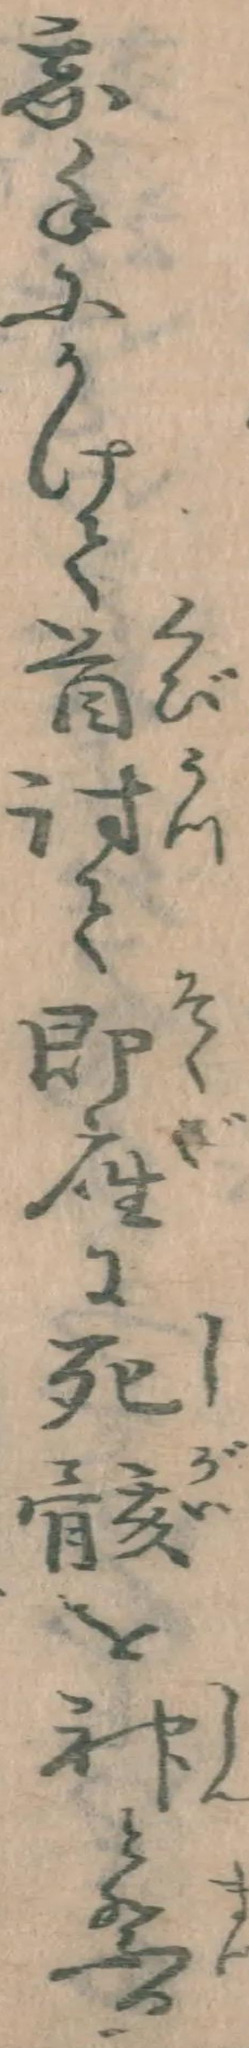我手にかけて首討て即座に死骸を神と祭る
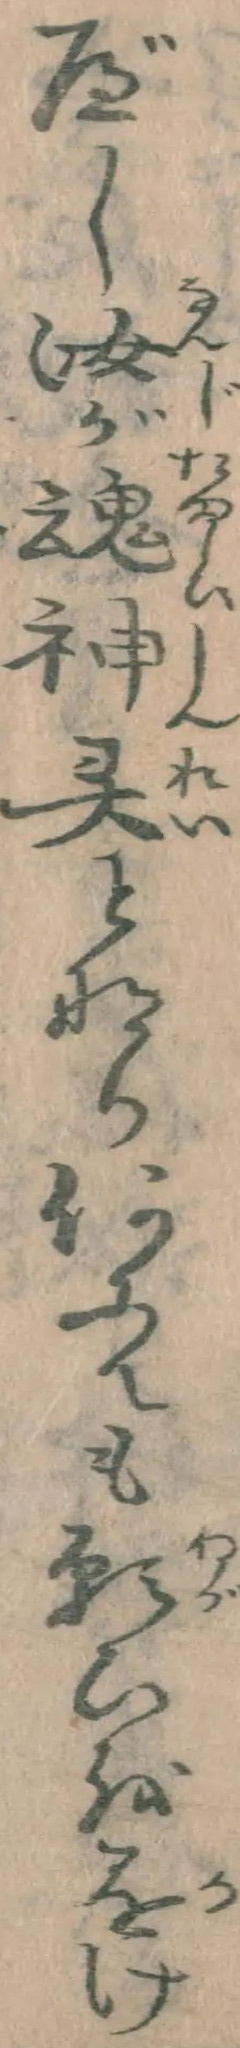べし汝が魂神霊となり何にても願ひを懸け
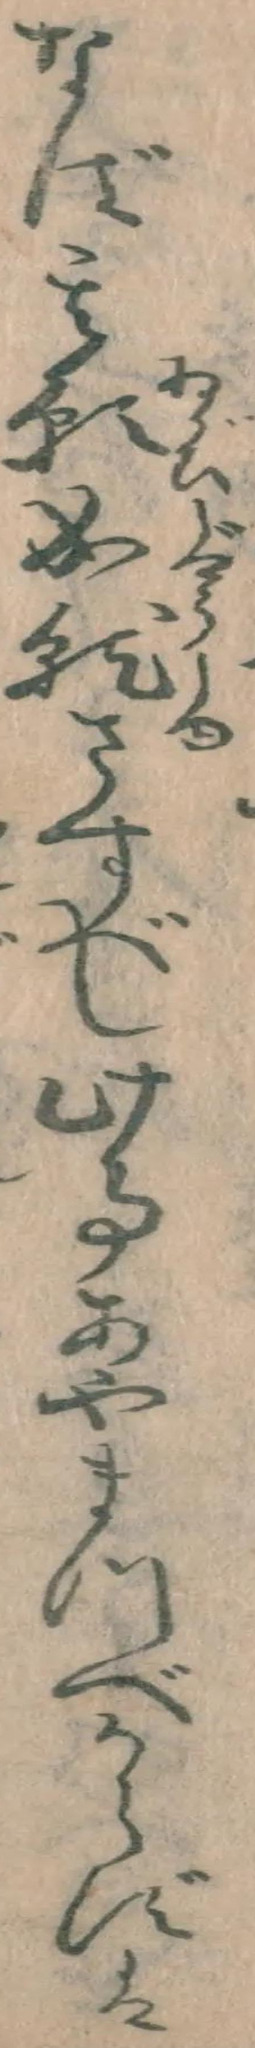なば其願成就さすべし此事あやまつべからずは
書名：怪談御伽童 5巻. [1]
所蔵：国立国会図書館 National Diet Library, JAPAN
